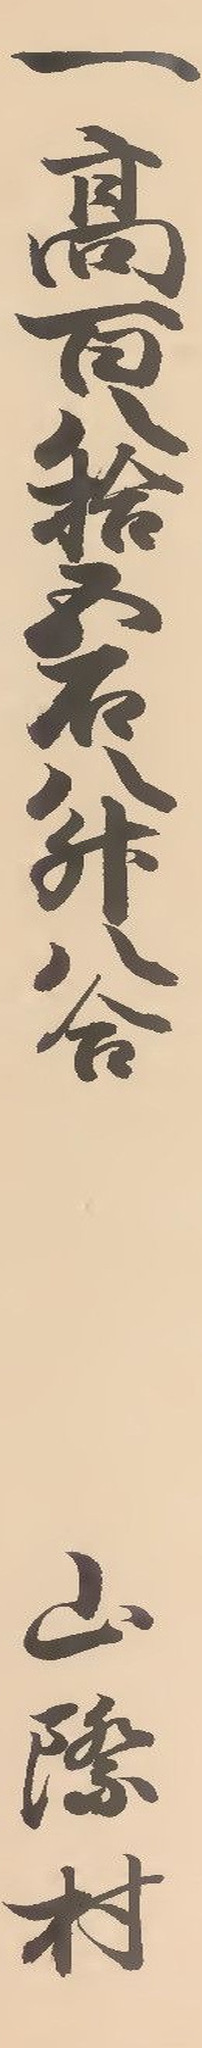一高百八拾五石八升八合山際村
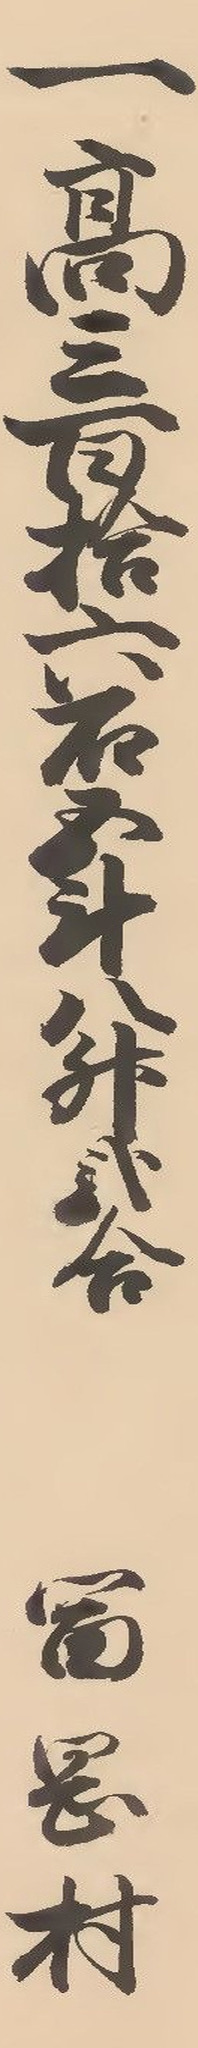一高三百拾六石五斗八升弐合富岡村
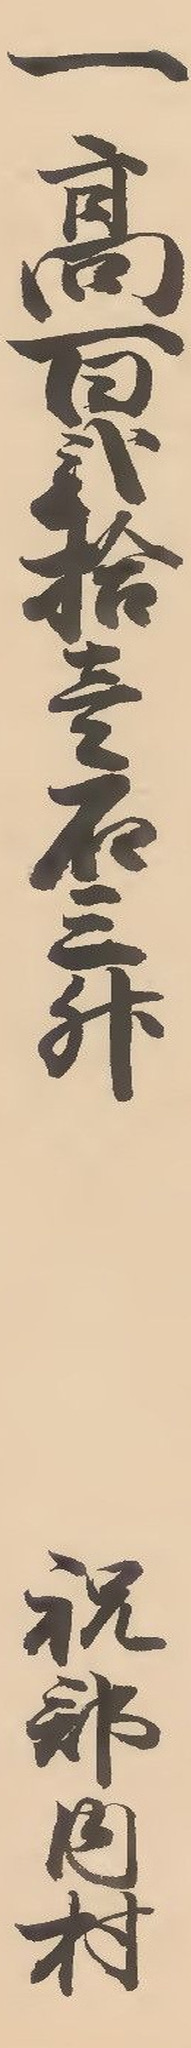一高百弐拾壱石三升祝部内村

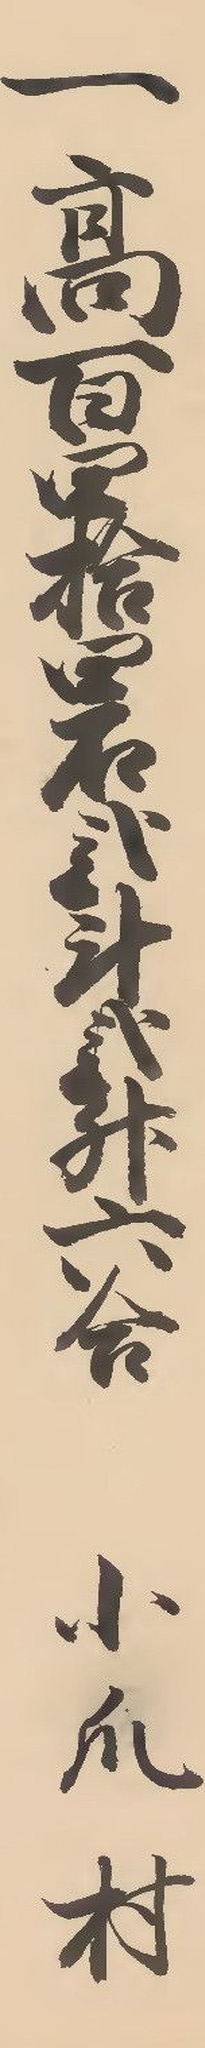一高百四拾四石弐斗弐升六合小爪村
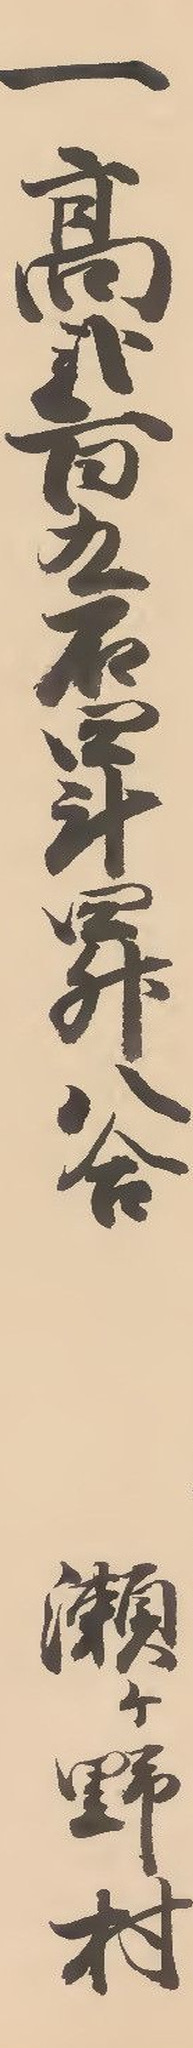一高弐百九石四斗四升八合瀬ヶ野村
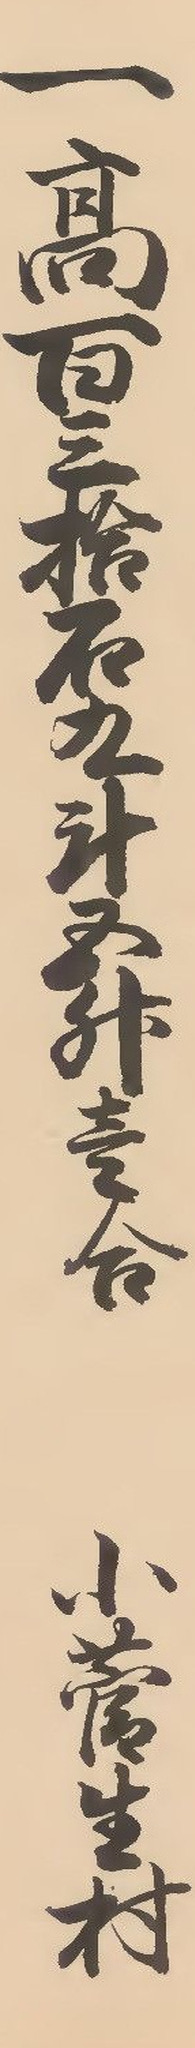一高百三拾石九斗五升壱合小菅生村
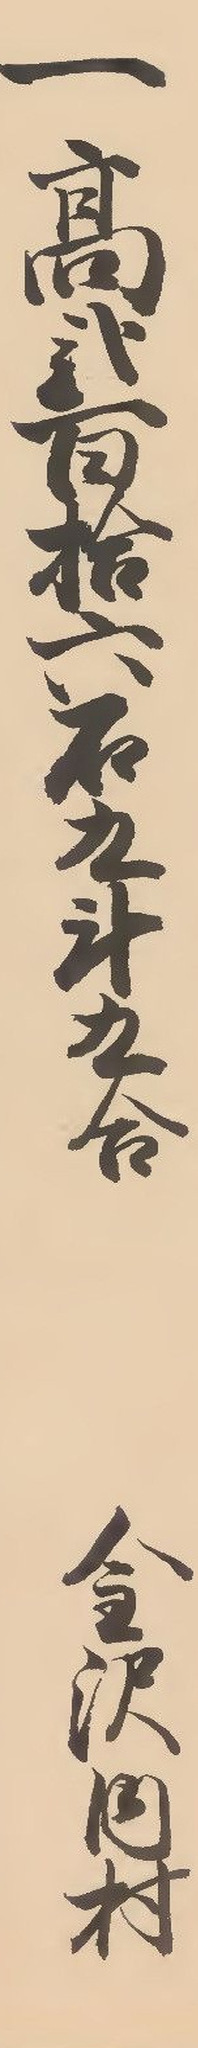一高弐百拾六石九斗九合金沢内村
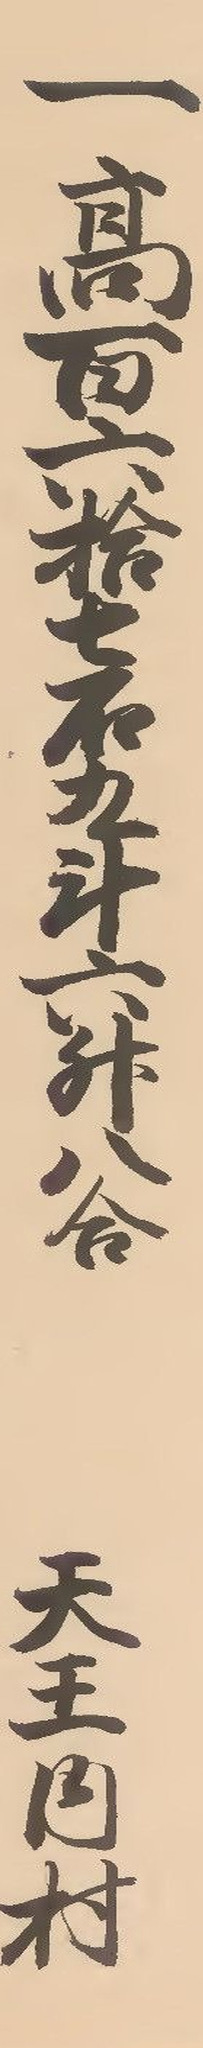一高百六拾七石九斗六升八合天王内村
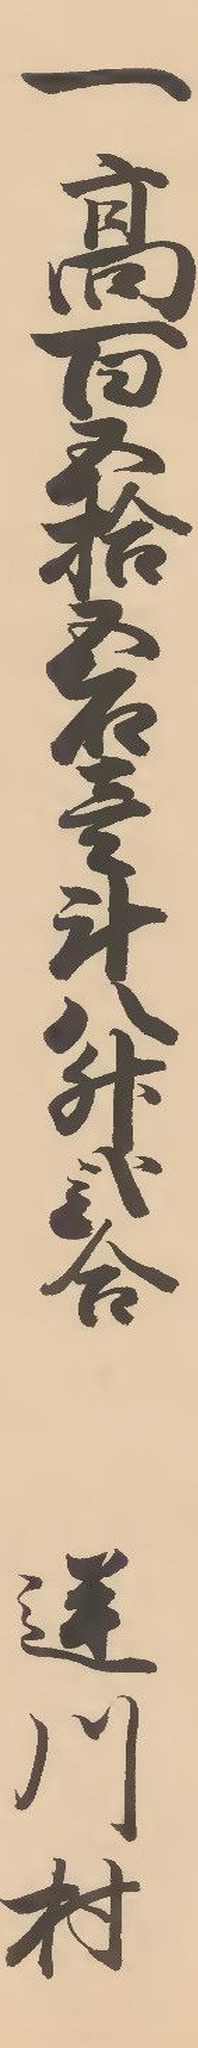一高百五拾五石壱斗八升弐合逆川村
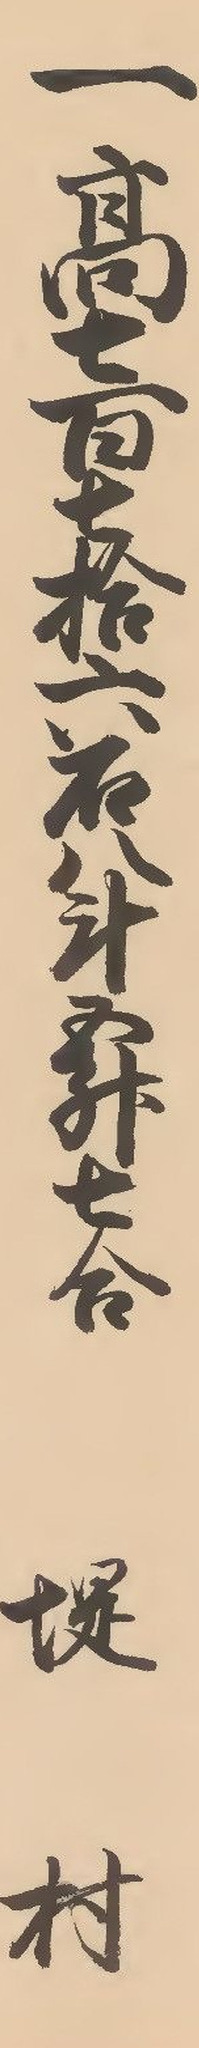一高七百七拾六石八斗五升七合堤村
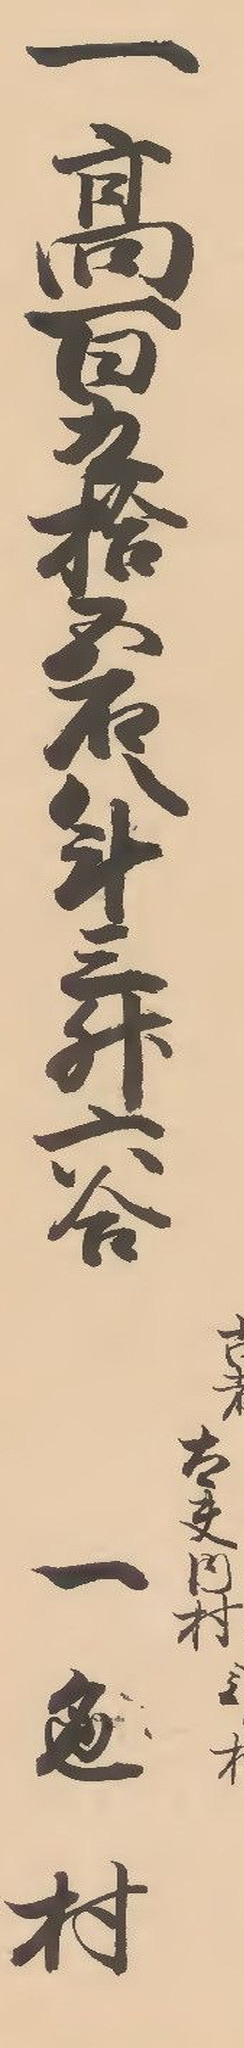一高百九拾五石八斗三升六合一色村

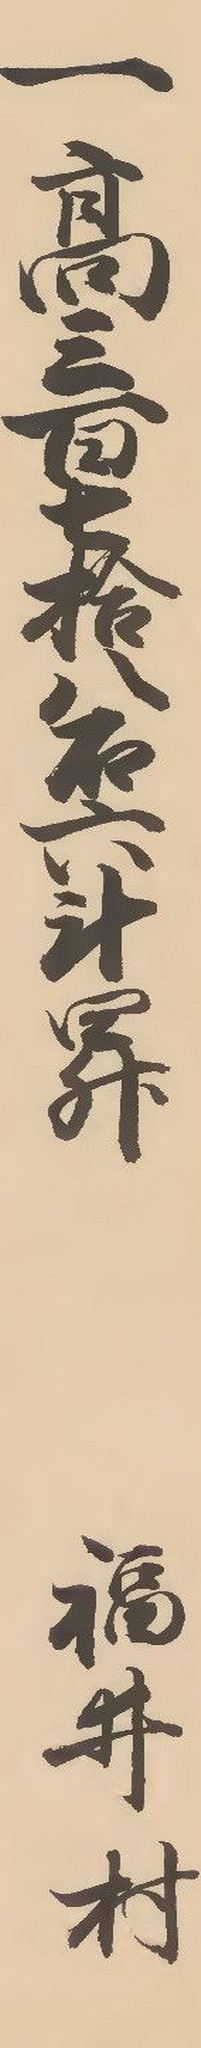一高三百七拾八石六斗四升福井村
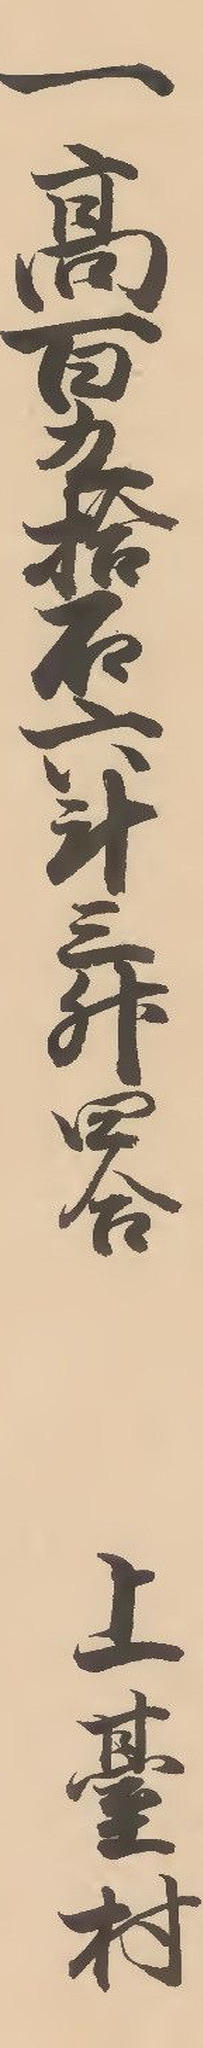一高百九拾石六斗三升四合上台村
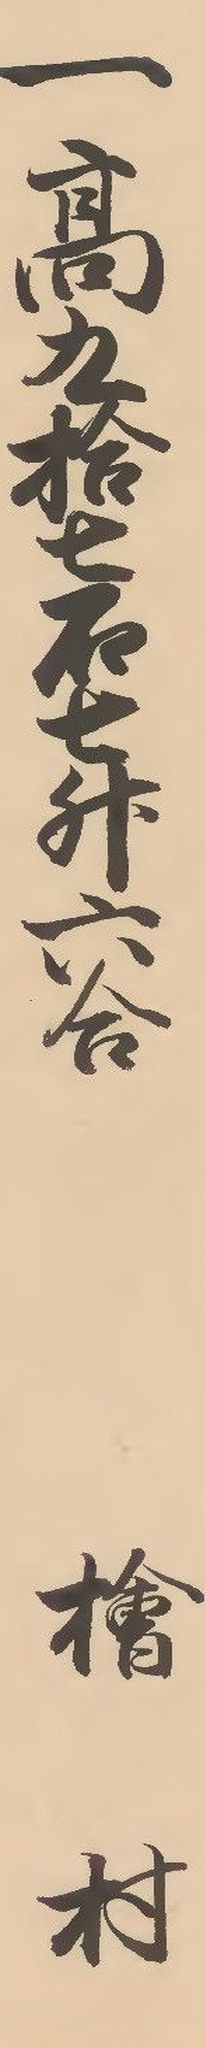一高九拾七石七升六合檜村
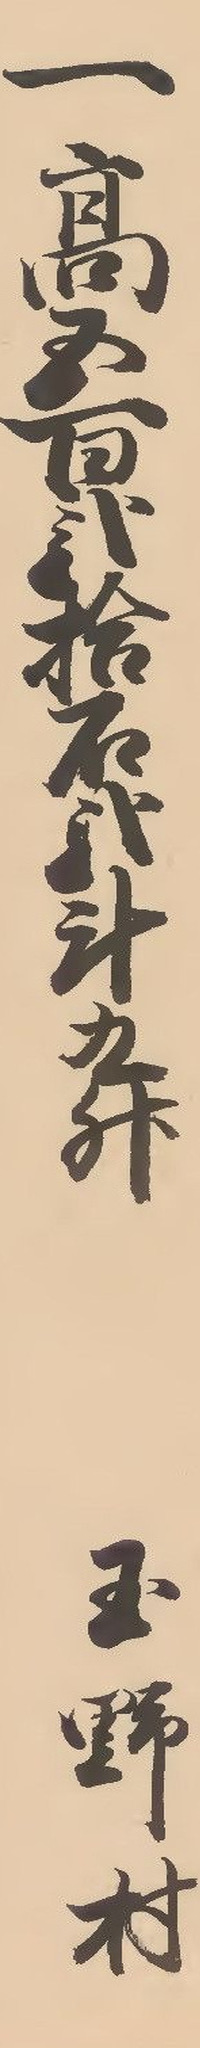一高五百弐拾石弐斗九升玉野村
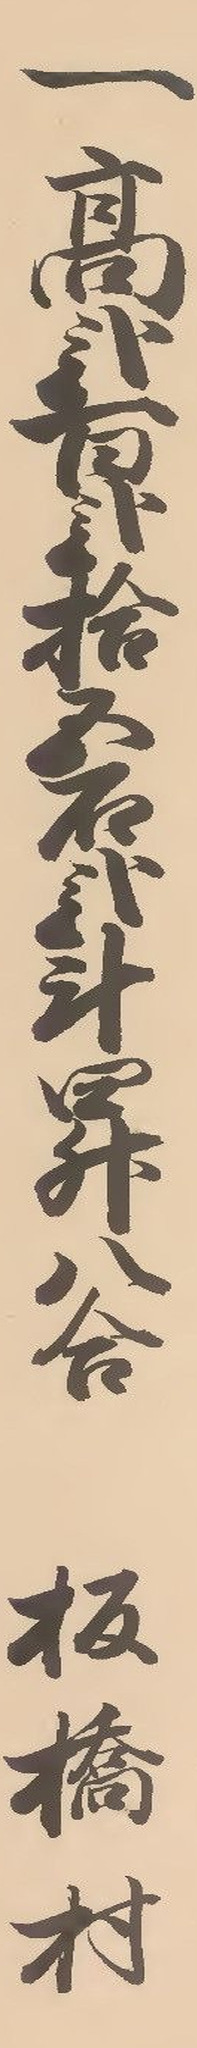一高弐百弐拾五石弐斗四升八合板橋村
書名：陸奥国郷帳　３
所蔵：国立公文書館 National Archives of Japan
